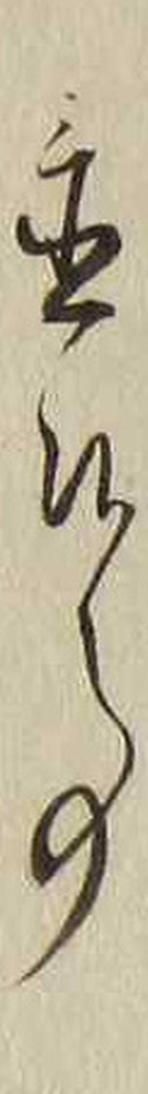置候事
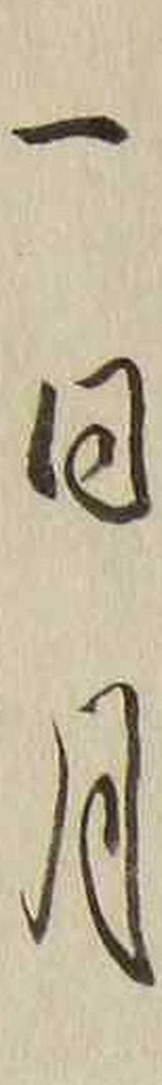一同月

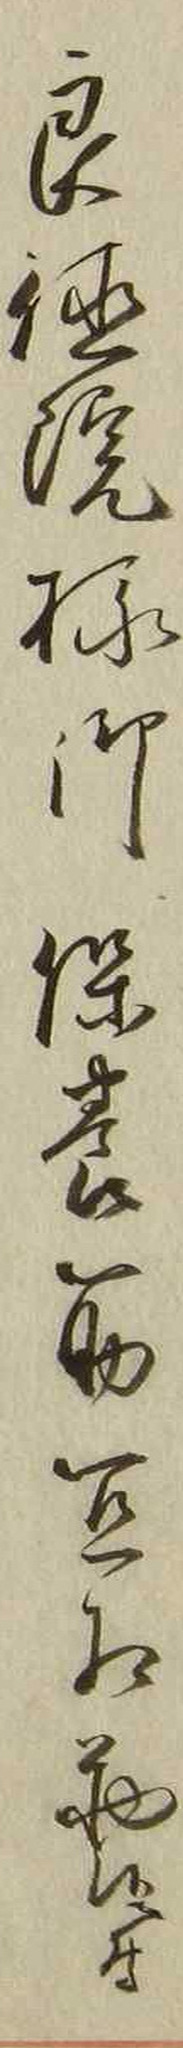良徳院様御保養之筋宜相勤候ニ付
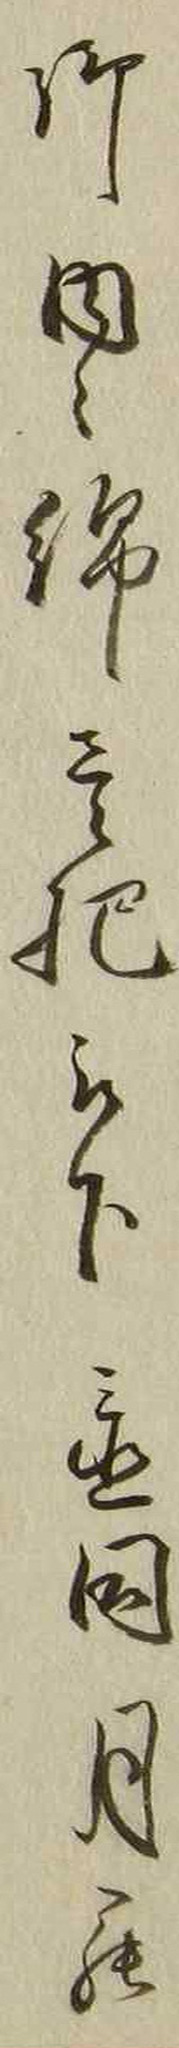御内々綿壱把被下置同月罷
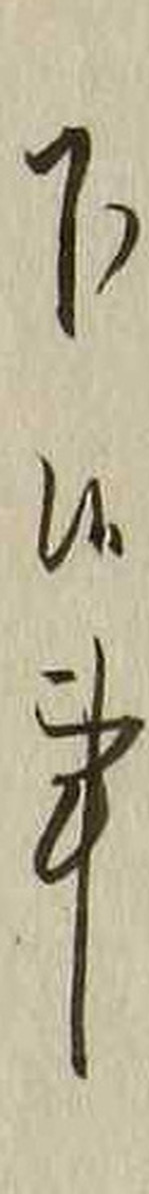下候事
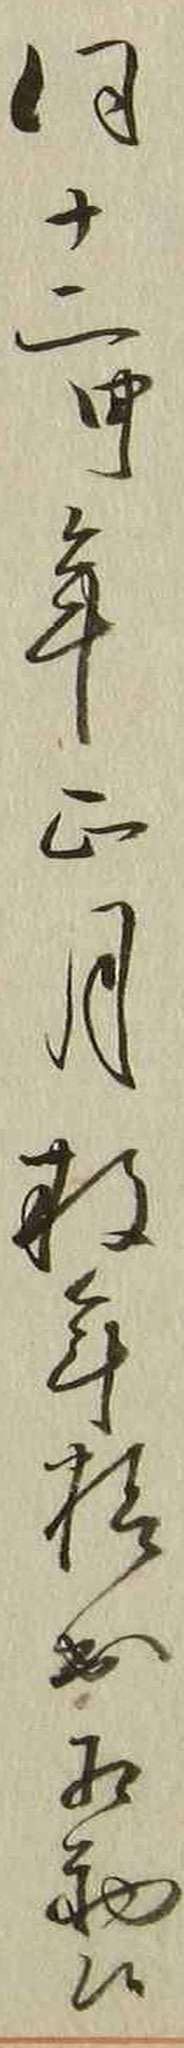同十二申年正月数年精出相勤候
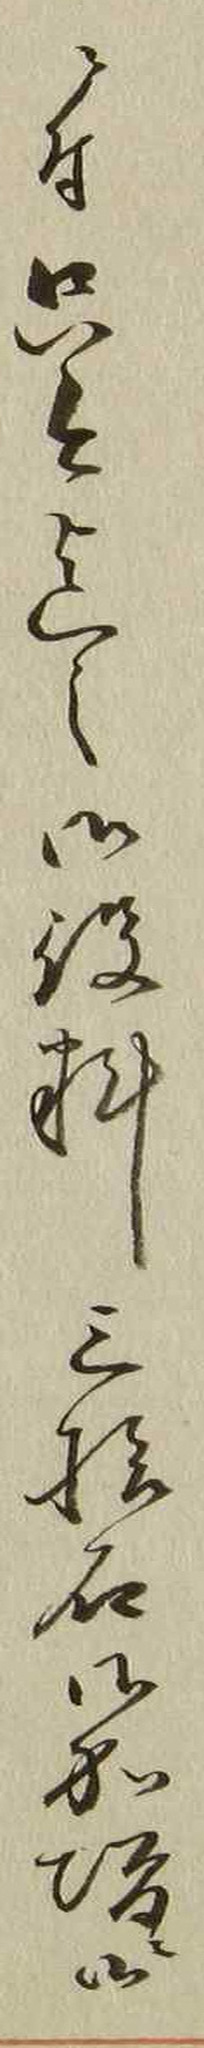ニ付只今迄之御役料三拾石御加増ニ御
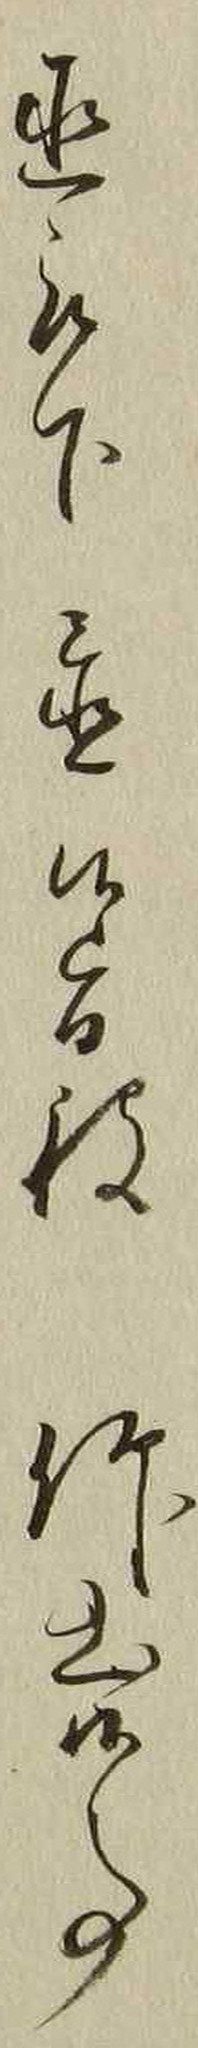置被下置候旨被仰出候事
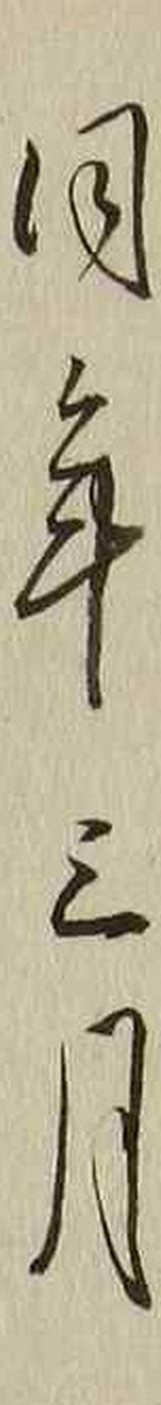同年三月
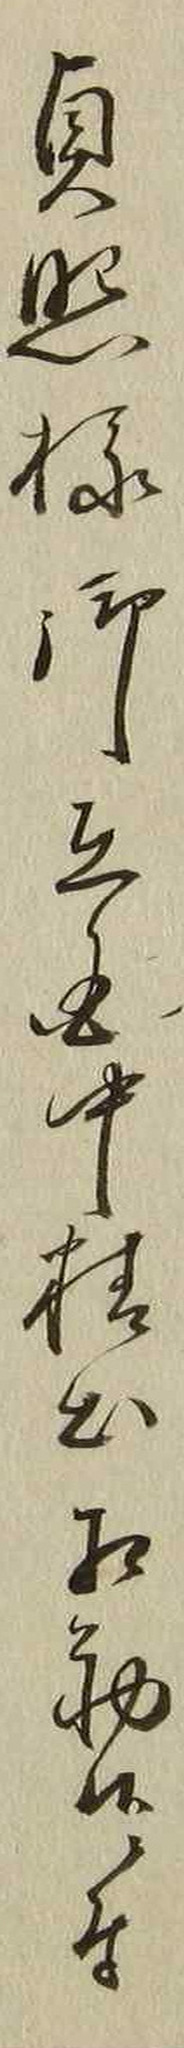貞照様御在国中精出相勤候ニ付
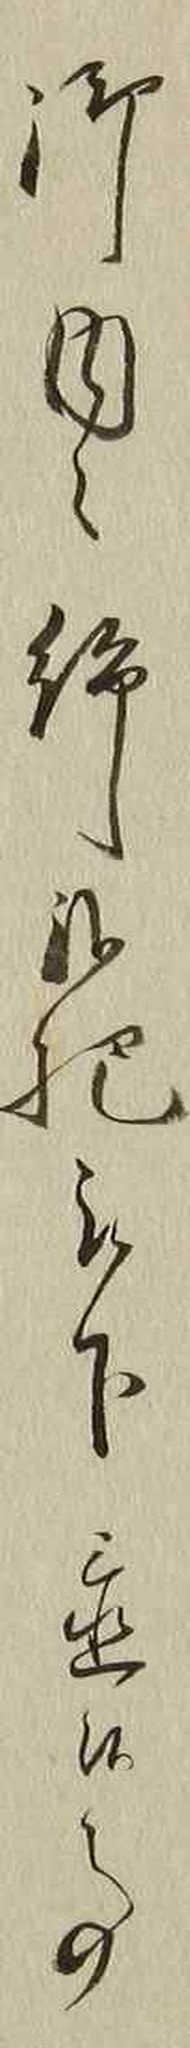御内々ニ綿弐把被下置候事
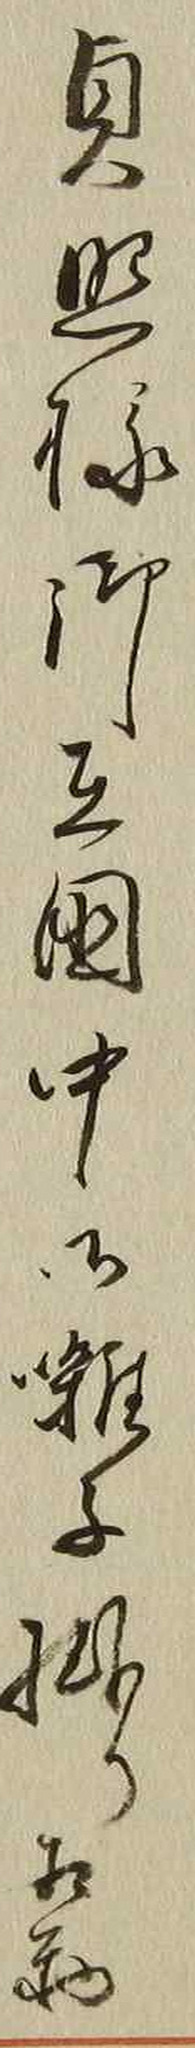貞照様御在国中御囃子掛り相勤
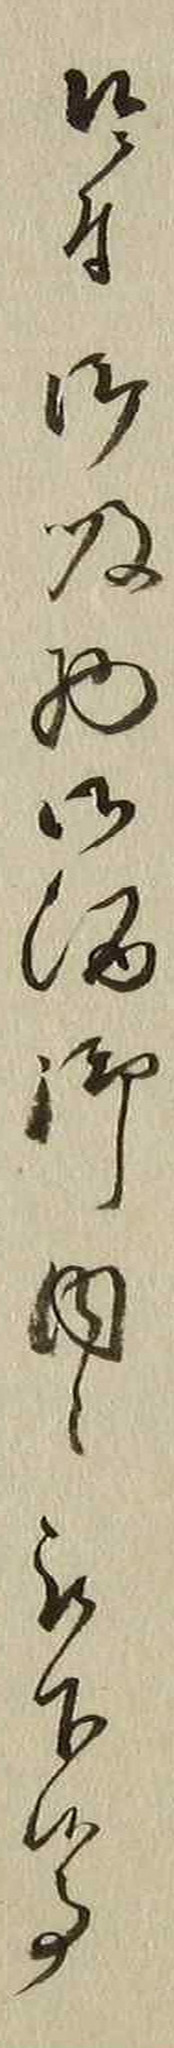候ニ付御吸物御酒御内々被下置候事
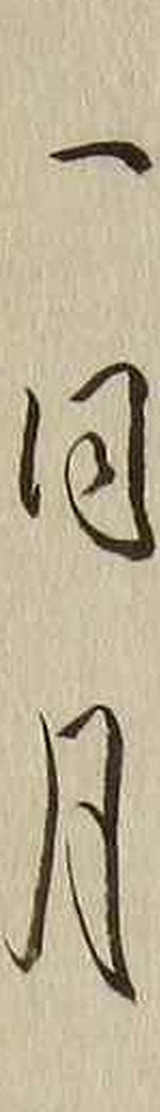一同月
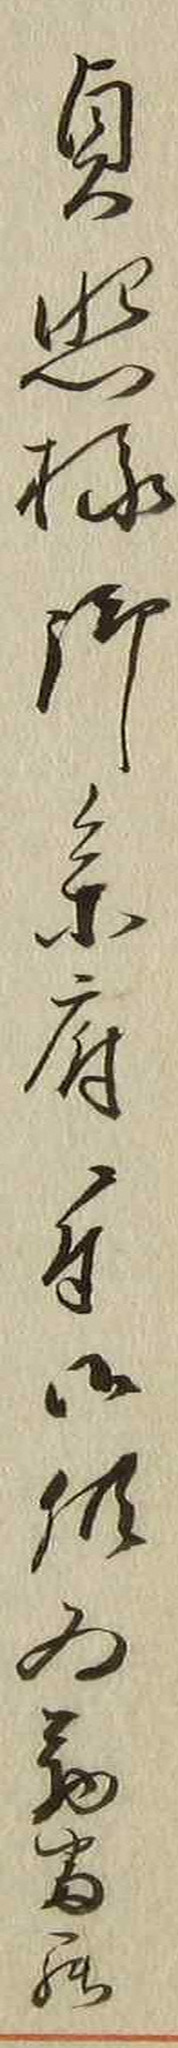貞照様御参府ニ付御供為勤番罷
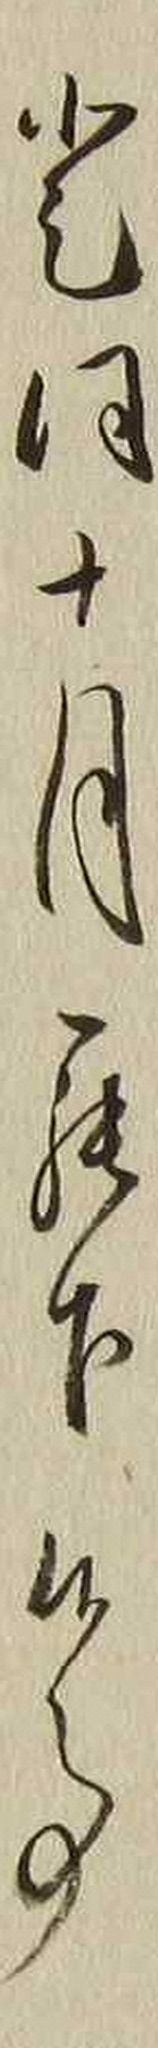登同十月罷下候事
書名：諸士系譜　巻之68　を之部2
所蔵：会津若松市立会津図書館
